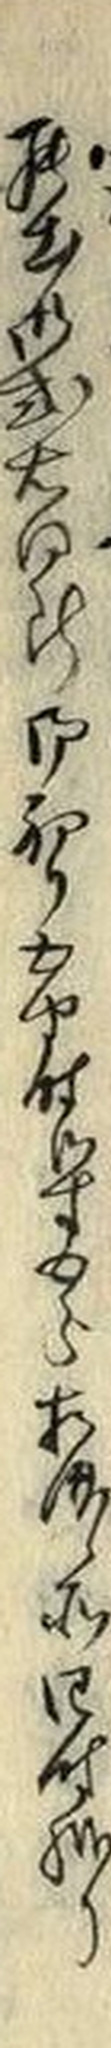罷出御式右同断御初り五半時弐寸五分相済候所四時掛り
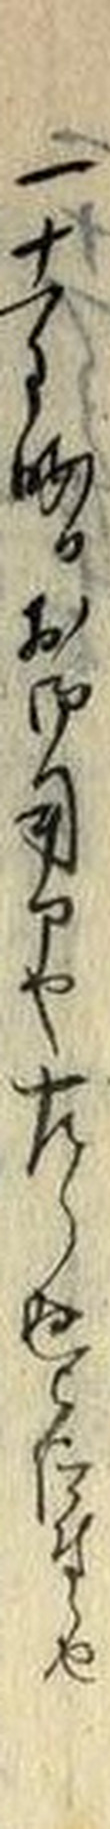一十一月晦日於御用部や左之通被仰付候由
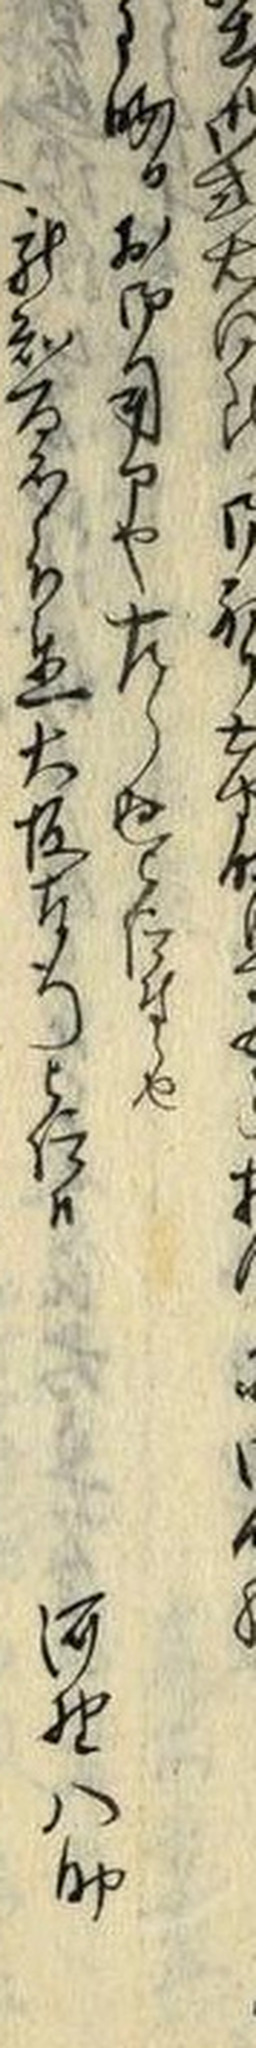新知百石被下置大坂奉行被仰付河野八助
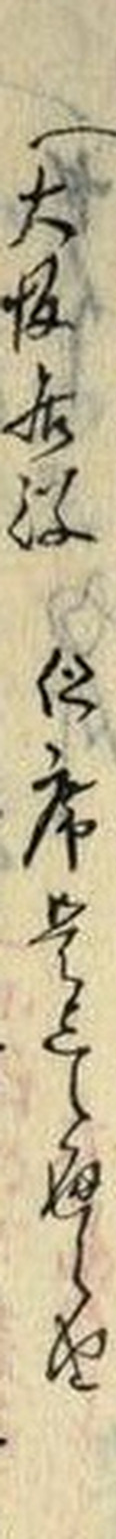大坂居役但席是迄之通之由
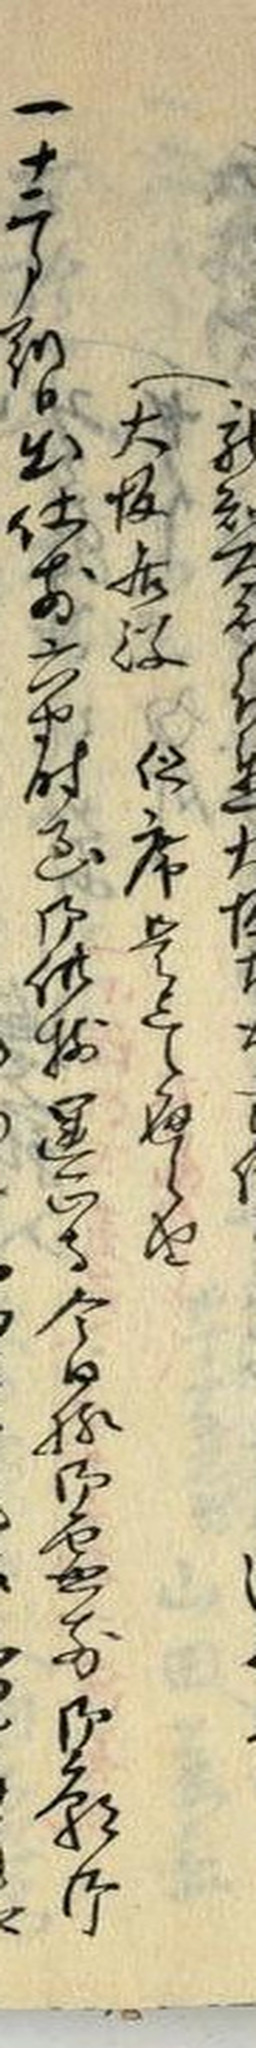一十二月朔日出仕前六半時過御供揃運正寺令日様御霊前御廟御
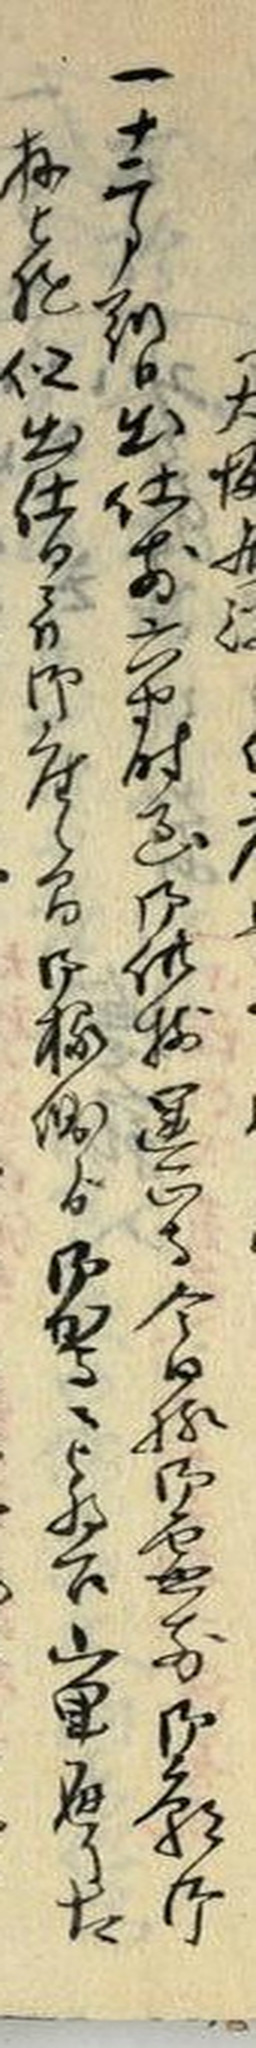拝被遊但出仕日ニ付御座之間御縁側ゟ御駕ニ被為召山里通り太
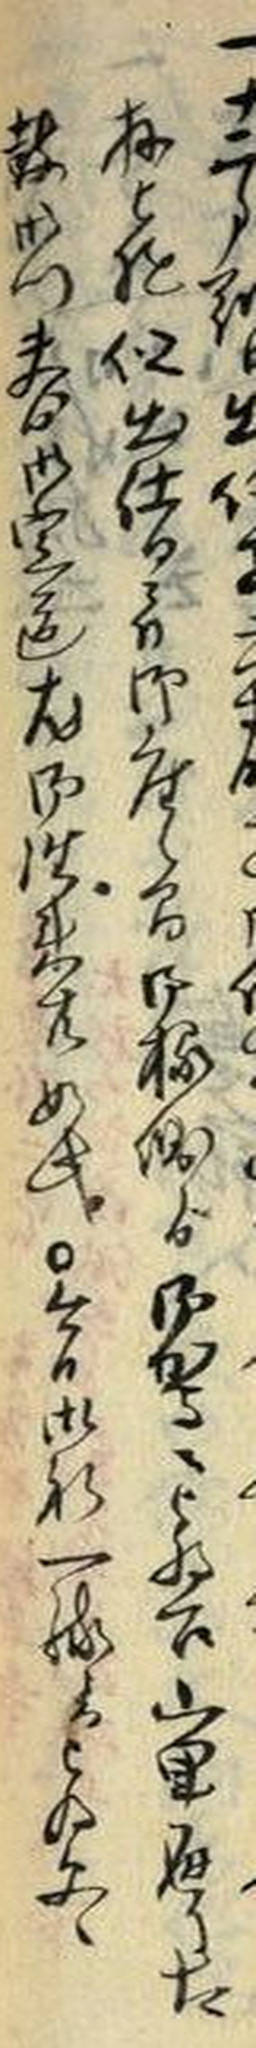鼓御門夫ゟ御定道尤御往来共如此〇今日御礼一統ニ而被為受候
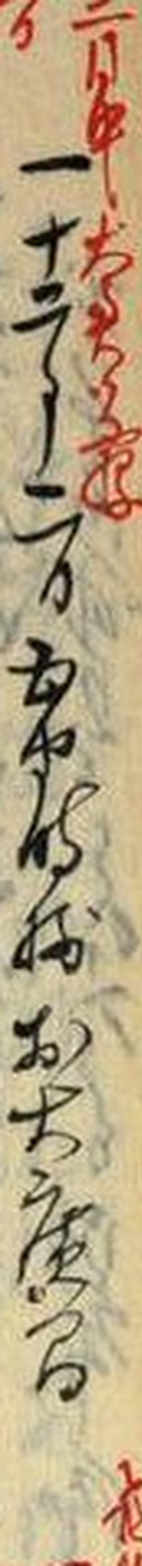一十二月二日五半時揃於大広間
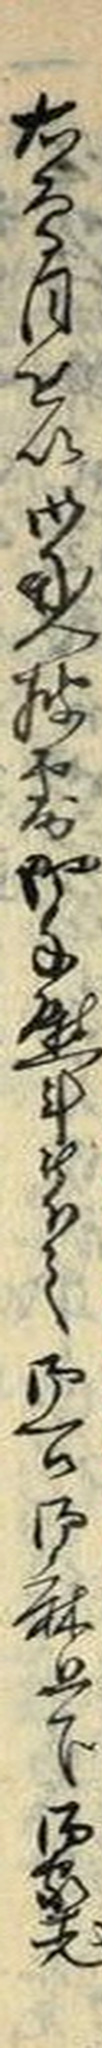右鳥目を以御用人披露御手慰斗被下之御召御麻上下御家老
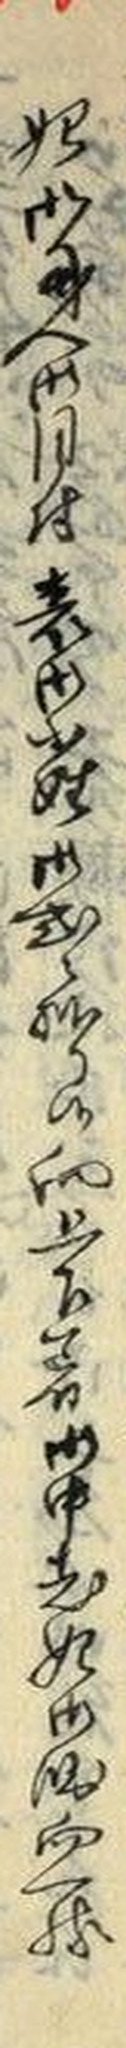始御用人御目付表御小姓御式ニ掛り候向上下着御中老始御側向一統
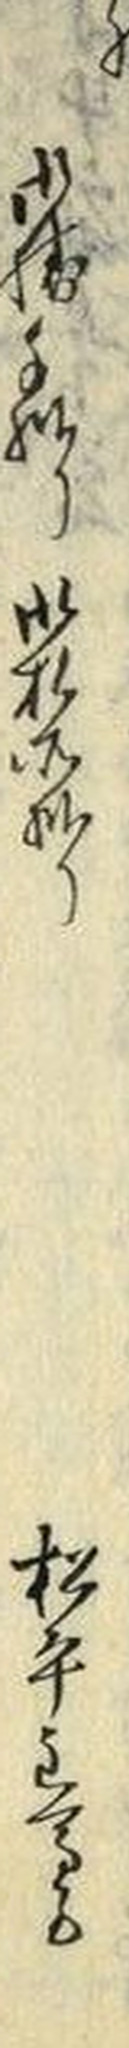御勝手掛り御札所掛り松平主馬方
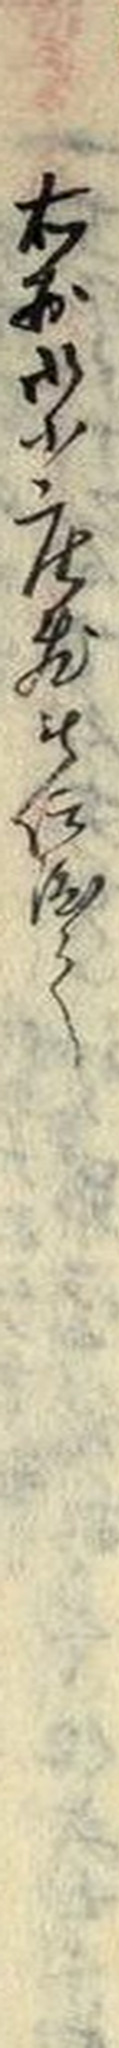右於御小座敷被仰渡之
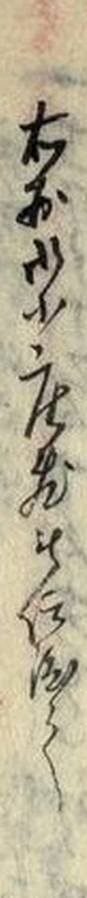右於御小座敷被仰渡之
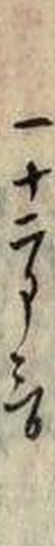一十二月三日
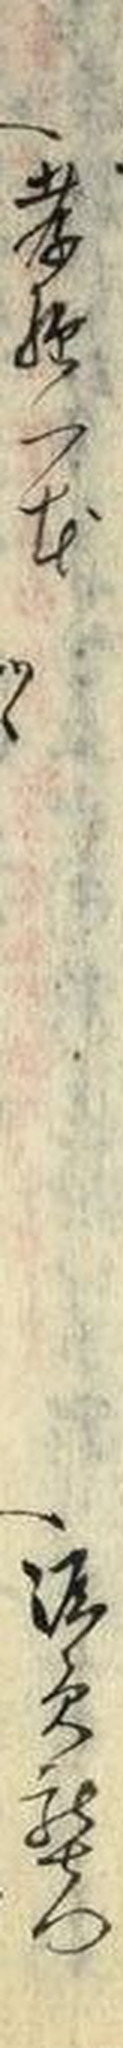孝経一本ツヽ渥美新右衛門
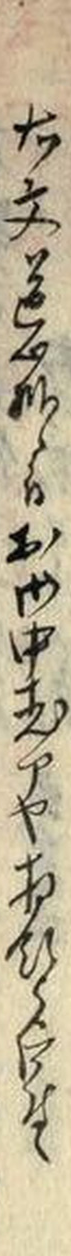右文道心掛候ニ付於御中老部や拝領被仰出候
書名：少傅日録抄（斉承付側向頭取日記、在国）
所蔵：福井県文書館 Fukui Prefectural Archives
